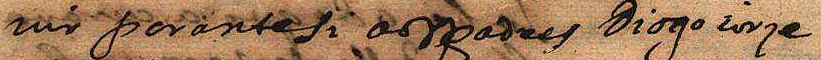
uir perante si aos padres Diogo iorze
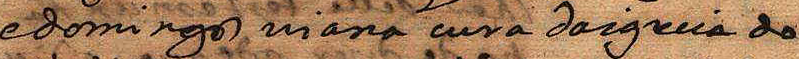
e domingos uiana cura da igreia do
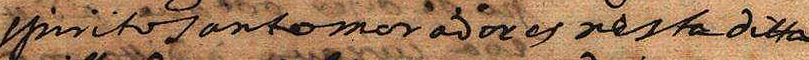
spirito santo moradores nesta ditta
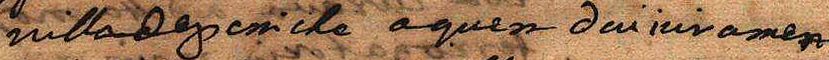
uilla de peniche a quem deu iuramen
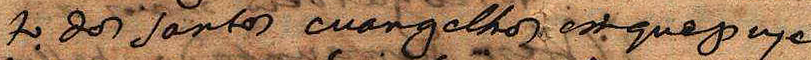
to dos santos euangelhos em que puze
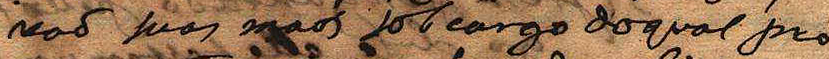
raõ suas mãos sob cargo ao qual pro
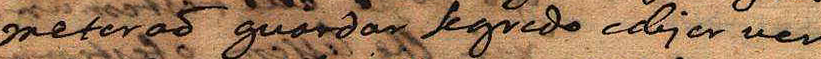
meteraõ guardar segredo e dizer uer
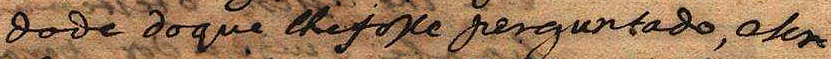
dade do que lhe fosse perguntado, e sen
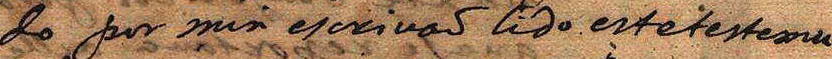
do por mim escriuaõ lido este testemu
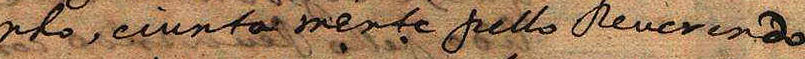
nho, e iuntamente pello Reuerendo
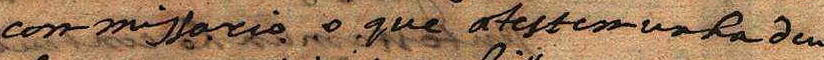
commissario o que a testemunha deu
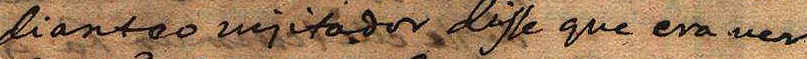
diante o uizitador disse que era uer
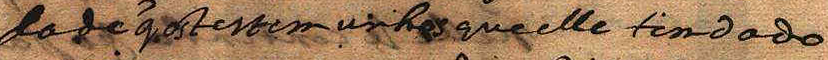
dade q̄ os testemunhos que elle tem dado
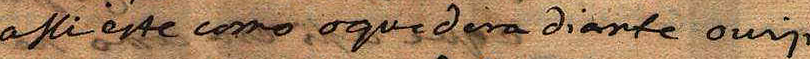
assi este como o que dera diante o uizi
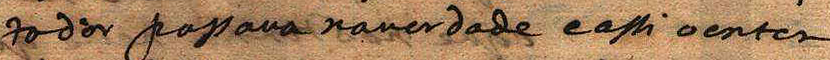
tador passaua na uerdade e assi o enten
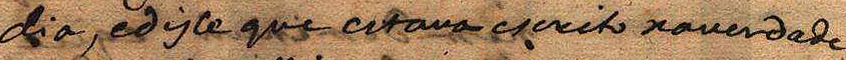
dia, e disse que estava escrito na uerdade
